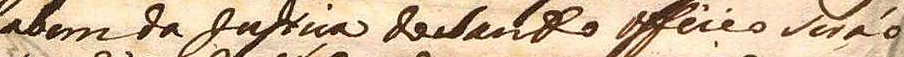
a bem da Justiça do Santo offiçio seraõ
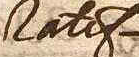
Ratif
